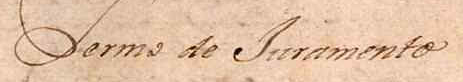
Termo de Iuramento
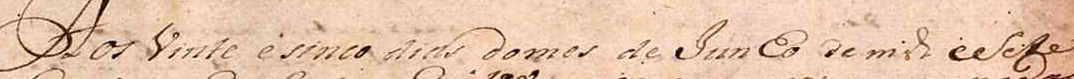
Aos Vinte e sinco dias do mes de Iunho de mil e sete
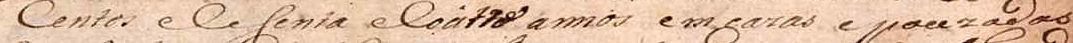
Centos e Cesenta e Coatro annos em cazas e pouzadas
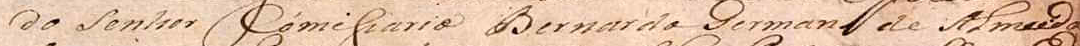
do senhor Comissario Bernardo German de Almeida
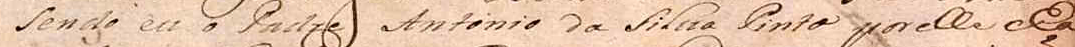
sendo eu o Padre Antonio da Silua Pinto por elle cha
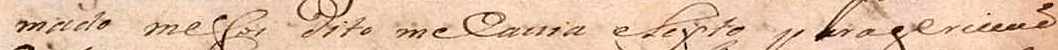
mado me foi dito me hauia eLeyto para escriuaõ
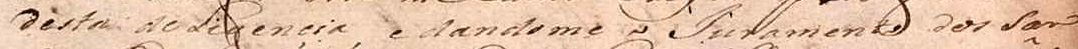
desta deligencia e dandome o Juramento dos san
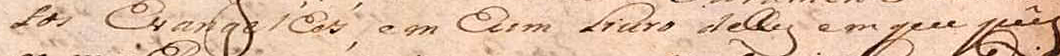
tos Evangelhos, em hum Liuro delles em que pûs
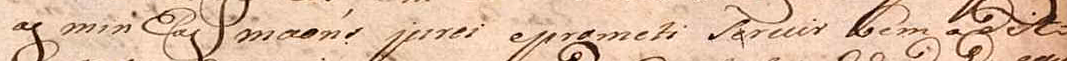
as minhas maons jurei e prometi seruir bem o dito
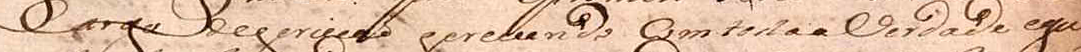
Cargo de escriuaõ escreuendo com toda a Verdade e gu
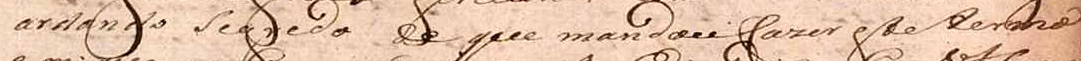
ardando segredo de que mandou fazer este termo
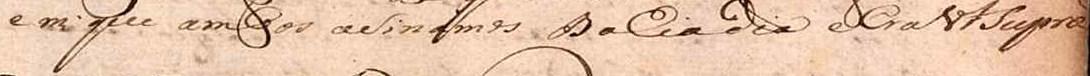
em que ambos asinamos Bahia dia e Era Vt supra
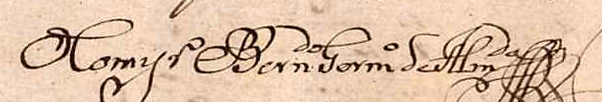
O Comiss.o Bern.do Gorm.o de Alm.da
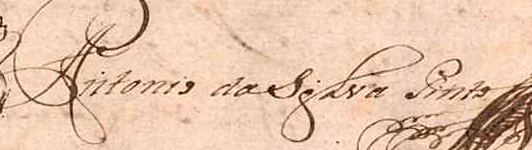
Antonio da Sylva Pinto
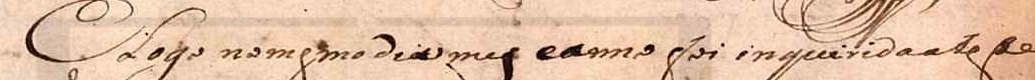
E Logo no mesmo dia mes e anno foi inquirida a teste
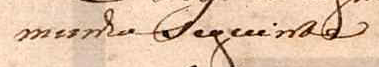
munha seguinte
